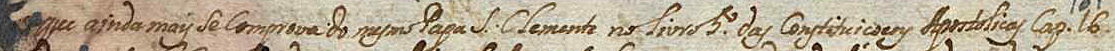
o que ainda mais se Comprova do mesmo Papa S. Clemente no livro 5.o das Constituiçoens Apostolicas Cap. 16
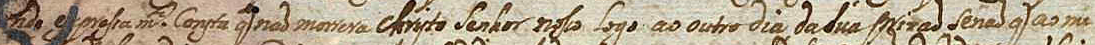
ndo e_pressam.te Consta q̄ naõ morrera Christo Senhor nosso logo ao outro dia da Sua prizaõ senaõ q̄ ao me
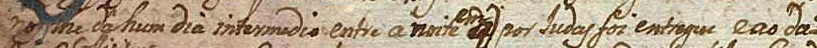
nos __ da hum dia intermedio entre a noite q̄ por Judas foi entregue, e ao da
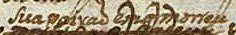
sua paixaõ em q̄ morreu
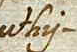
ut his
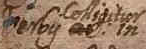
uerbis Colligitior
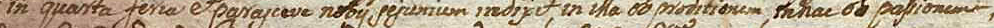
in quarta feria et parasceve nobis jejunium indixit, in illa ob proditionem, in hac ob passionem,
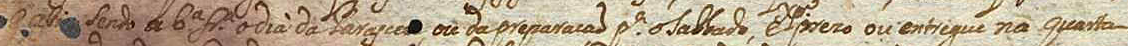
E asi_ sendo a 6a fr.a o dia da Parasce_, ou da preparaçaõ p.a o sabbado e prezo ou entregue na quarta
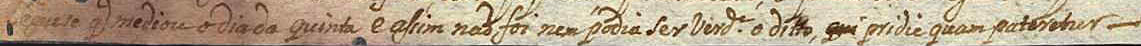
seguese q̄ mediou o dia da quinta, e assim naõ foi nem podia ser verd.e o ditto qui pridie quam pateretur
